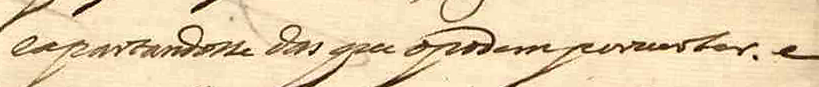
e apartandosse das que o podem perverter. e
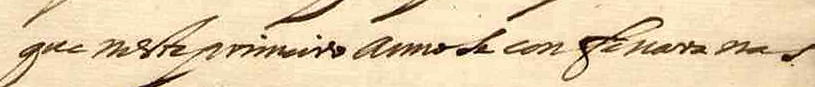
que neste primeiro anno se confessara nas
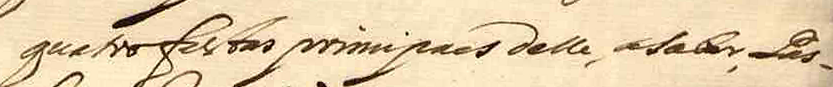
quatro festas principaes delle, a Saber, Pas
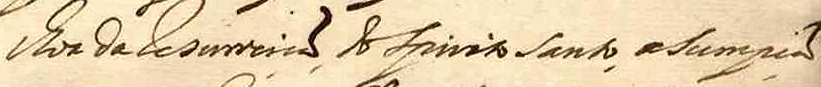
choa da Resurreiçaõ, do Spirito santo, asumpção
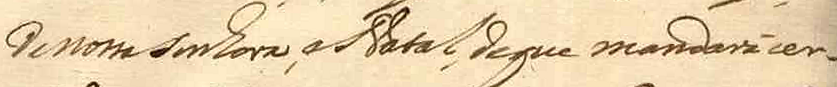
de nossa senhora, e Natal, de que mandará cer
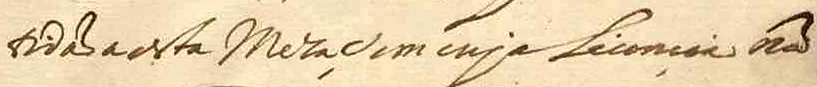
tidaõ a esta Meza, sem cuja Licença não
